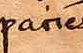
paciēs
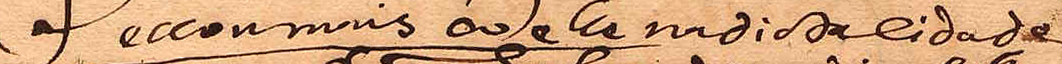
Peccou mais cō elle na dicta cidade
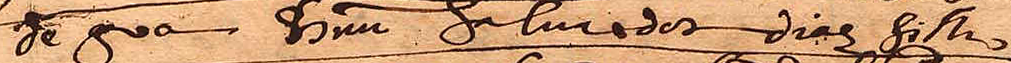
de goa hūu saluador dias filho
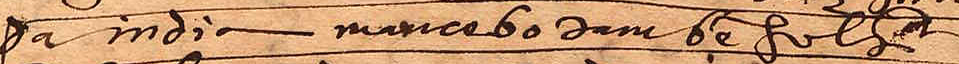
da india mancebo tambē soltro
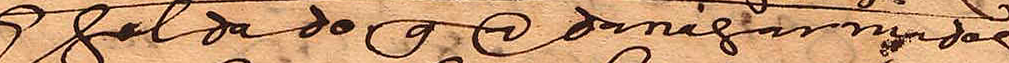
E soldado q̄ āda nas armadas
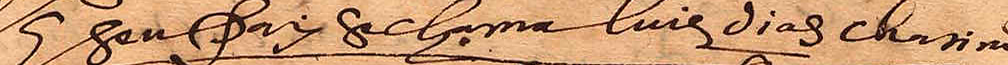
E seu pay se chama luis dias charim
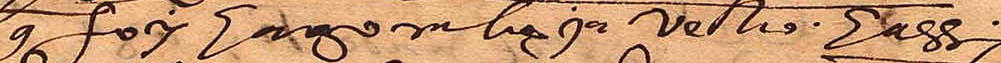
q̄ foy E agora he ja velho. E assj
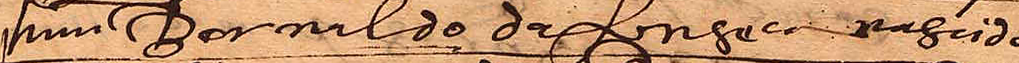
hūu Bernaldo da fonseca nascido
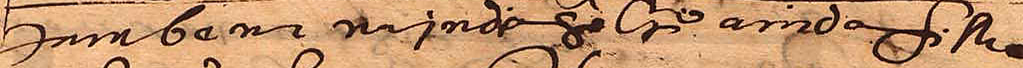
tambem na jndia soltro ainda filho
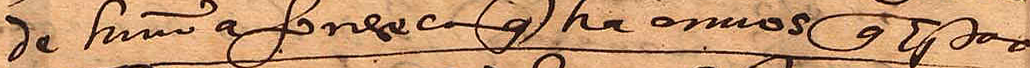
de hūu afonseca q̄ ha annos q̄ Estaa
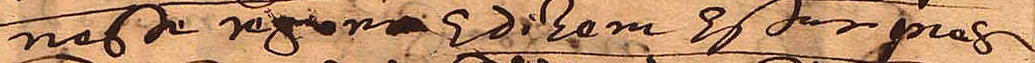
neste reg_n_ E dizem Estar preso
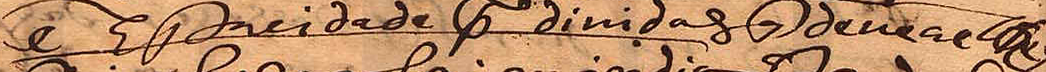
ē Esta cidade p̄o diuidas q̄ deue a el Rej
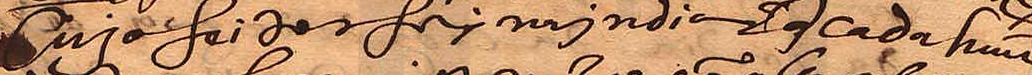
Cujo feitor foj na jndia E q̄ cada hūu
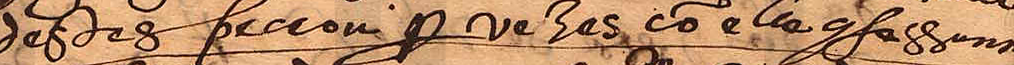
destes peccou ꝑ vezes cō elle ꝯfessante
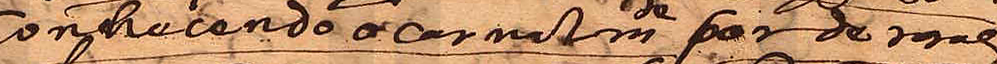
Conhecendoo carnalmte por de tras
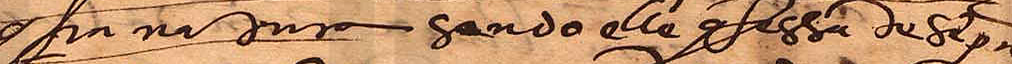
ꝯtra natura sendo elle ꝯfessāte sēpr
